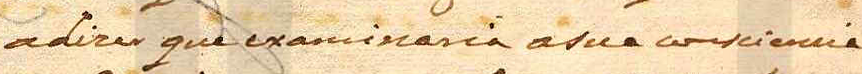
a dizer que examinaria a sua consciencia
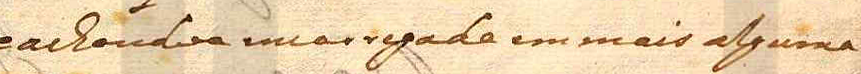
e achandoa encarregada em mais alguma
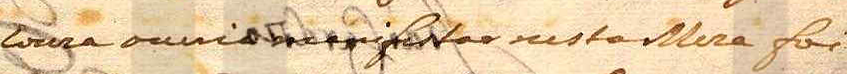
couza o ueio manifestar nesta Meza foi
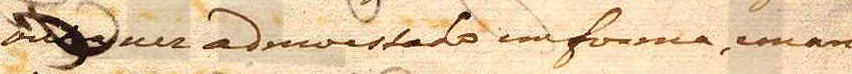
outra uez admoestado em forma, e man
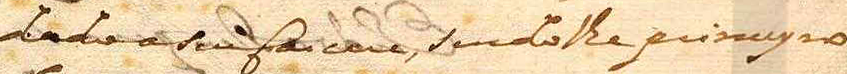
dado a seu Carcere, sendo lhe primeyro
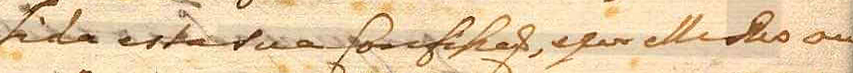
lida esta sua Confissaõ, e por elle Reo ou
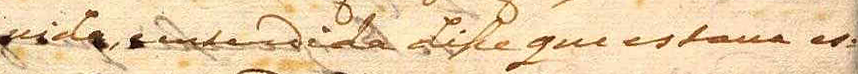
uida, e entendida disse que estaua es
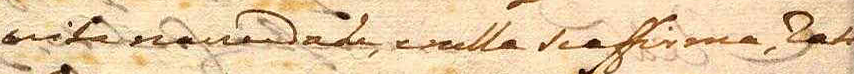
crita na uerdade, e nella se affirma, rati
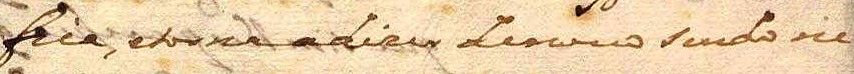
fica, e torna a dizer de nouo sendo ne
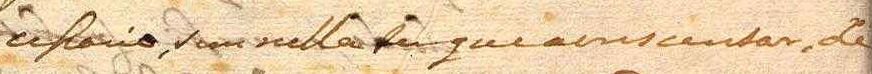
cessario, sem nella ter que acrescentar, de
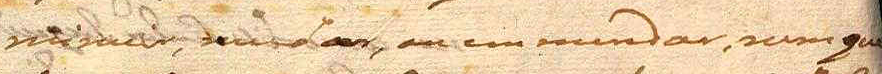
minuir, mudar, encommendar, nem que
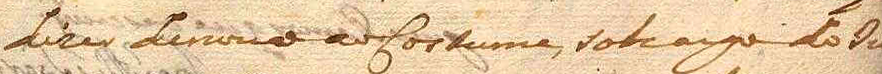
dizer de nouo ao Costume, sob cargo do Iu
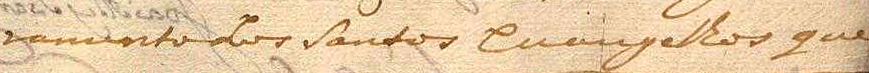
ramento dos Santos Euangelhos que
